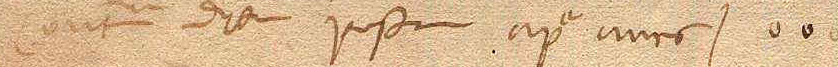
Contradyta posta a pe anes /
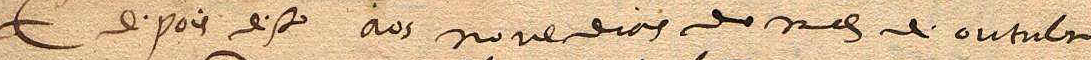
E depois desto aos noue dias do mes de outubro
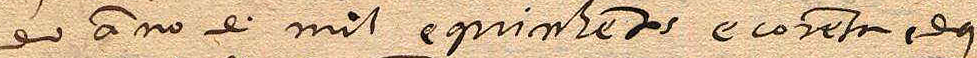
do āno de mil e quinhētos e corēta e dꝯ
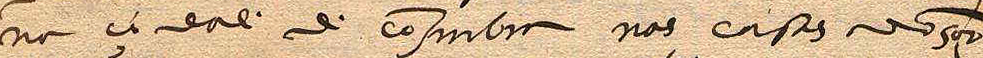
na çidade de coJmbra nas casas do s̄or
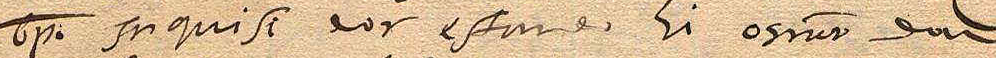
b̄po Jnquisidor estando hi o sn̄or dou
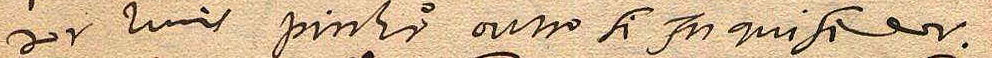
tor luis pinhro outrosi Jnquisidor
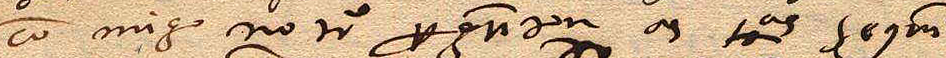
c̄omigo notro ꝑḡutou as tas segūi
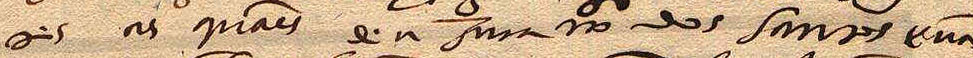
tes as quaes deu Juramto dos santos eūa
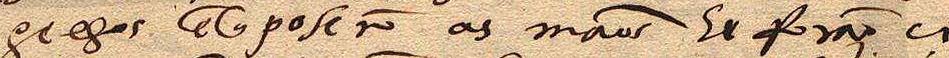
gelhos ē q̄ poser̄o as mãos he forão ci
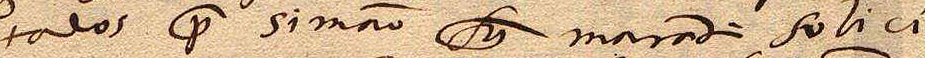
tados p̄ simão f̄rz marāte solici
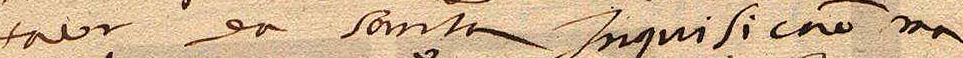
tador da santa Jnquisicão ma
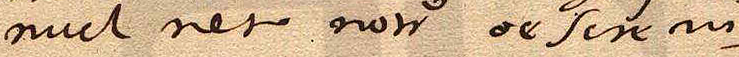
nuel neto notro o escreui
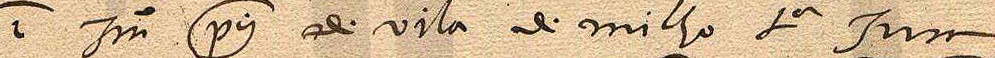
item Jmo p̄iz de vila de milho ta Jura
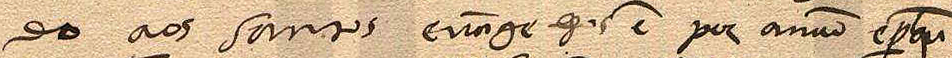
do aos santos eūagelhos ē pos a mão e ꝑḡu
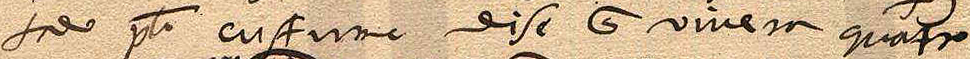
tado p̄lo custume dise q̄ viuera quatro
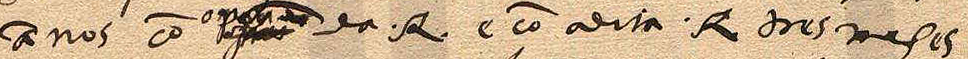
ānos c̄o _ da .R. e c̄o a dita .R tres meses
